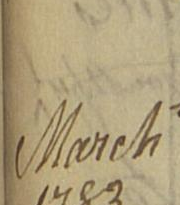March
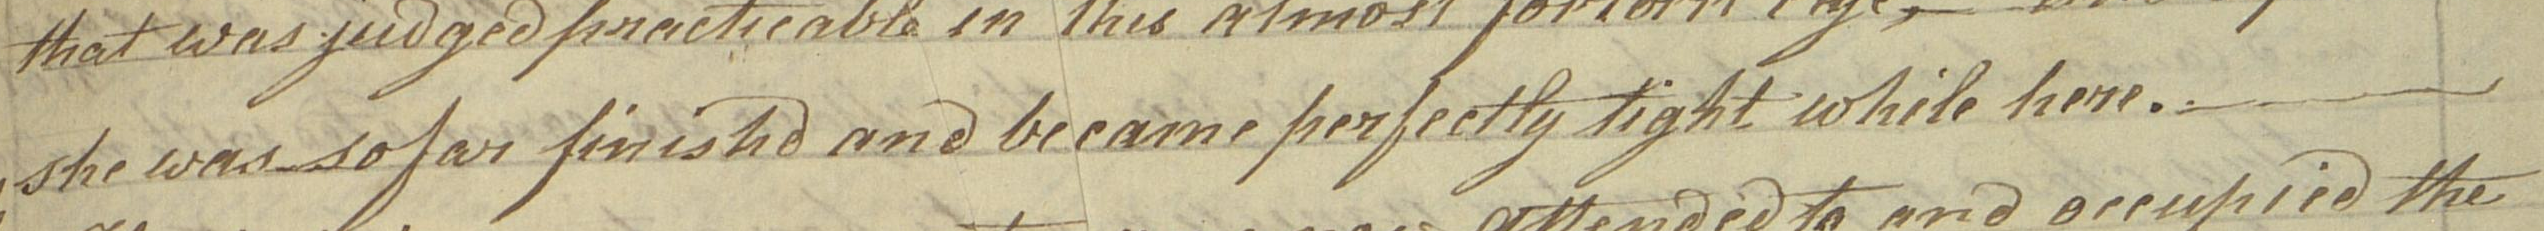she was so far finished and became perfectly tight while here.
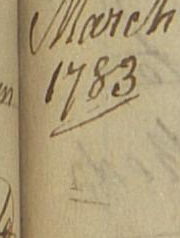1783
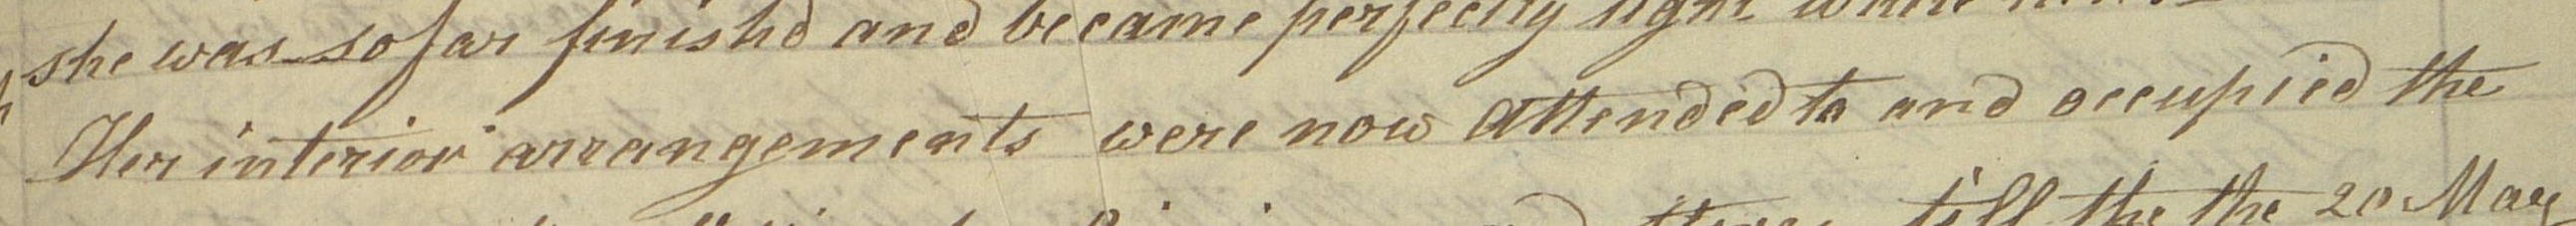Her interior arrangements were now attended to and occupied the
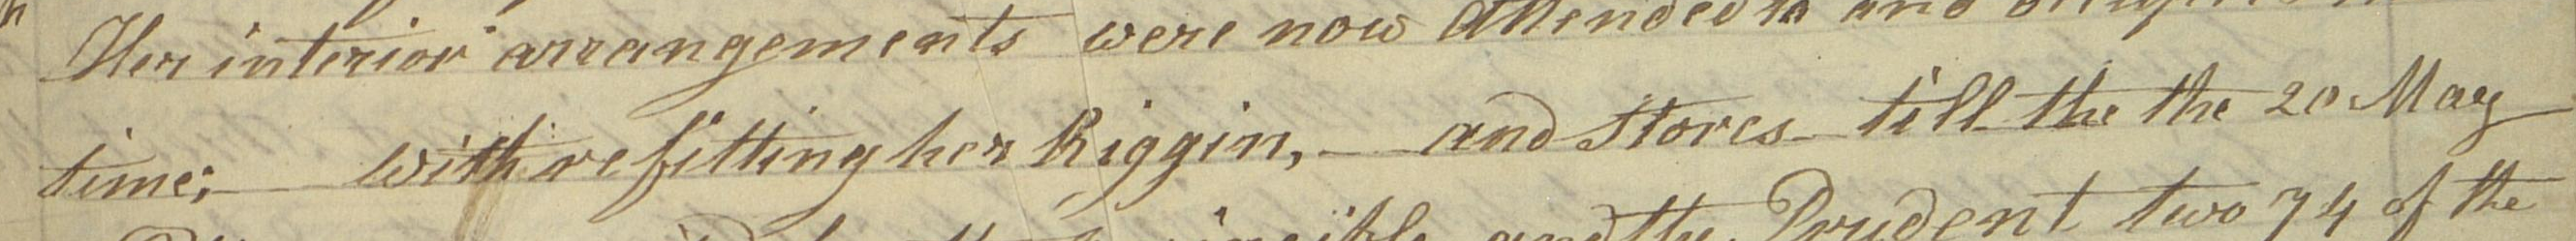time; with refitting her Riggin, and stores till the the 20 May
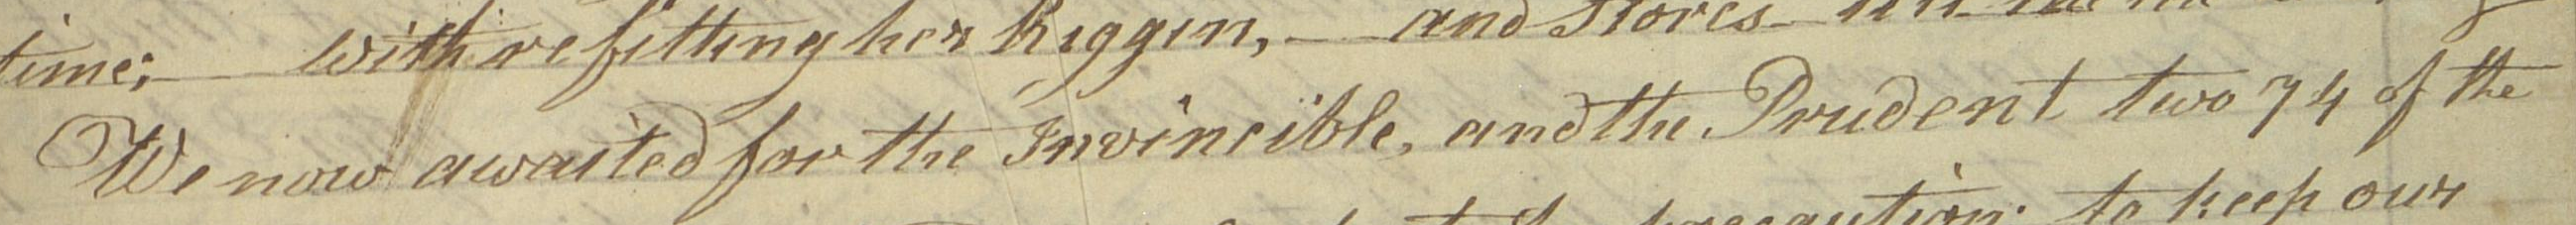We now awaited for the Invincible, and the Prudent two 74 of the
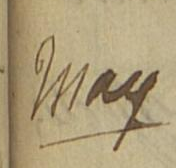May
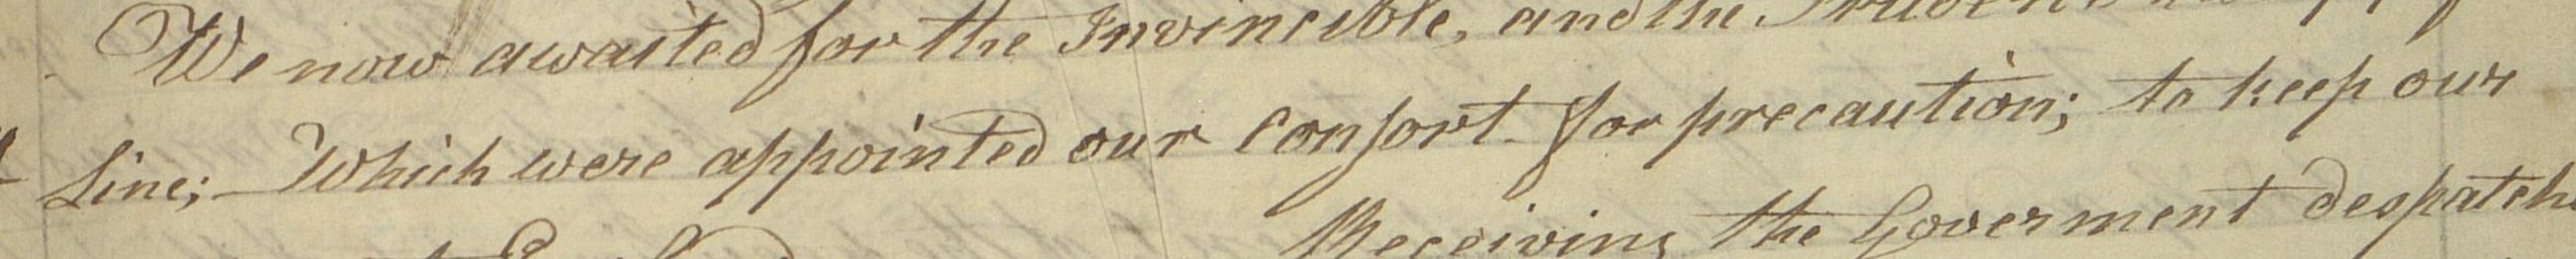Line; Which were appointed our consort for precaution; to keep our
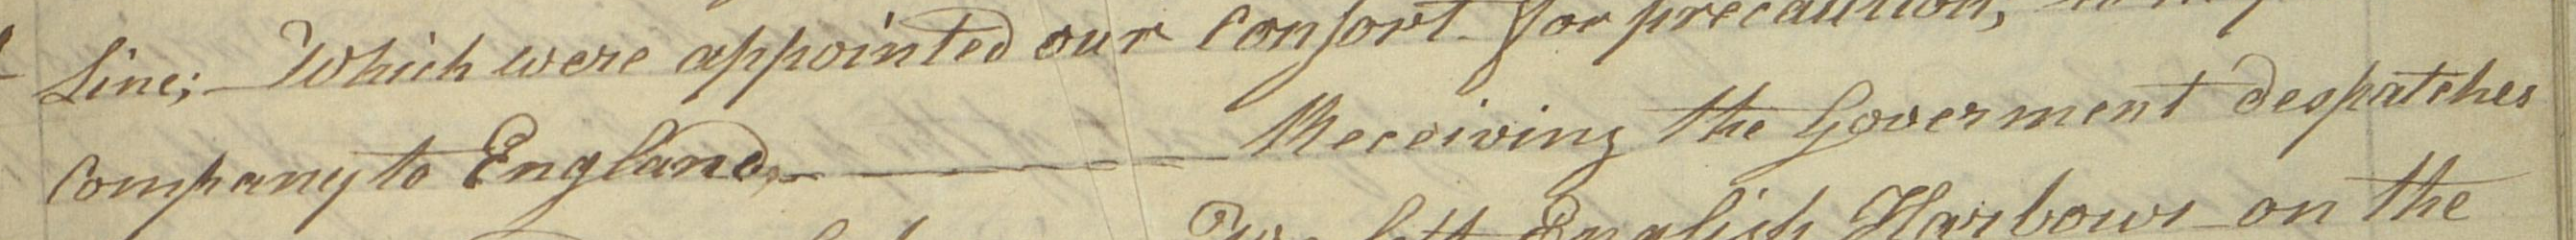Company to England, Receiving the Goverment despatches
